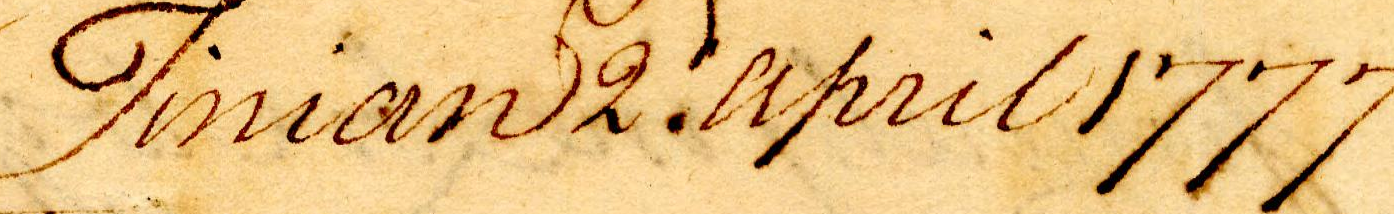Tinian 2^d. April 1777
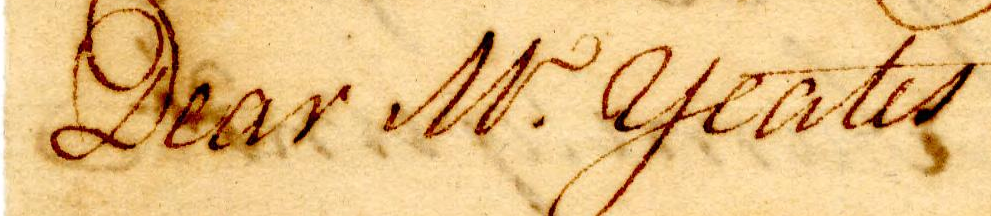Dear Mr. Yeates
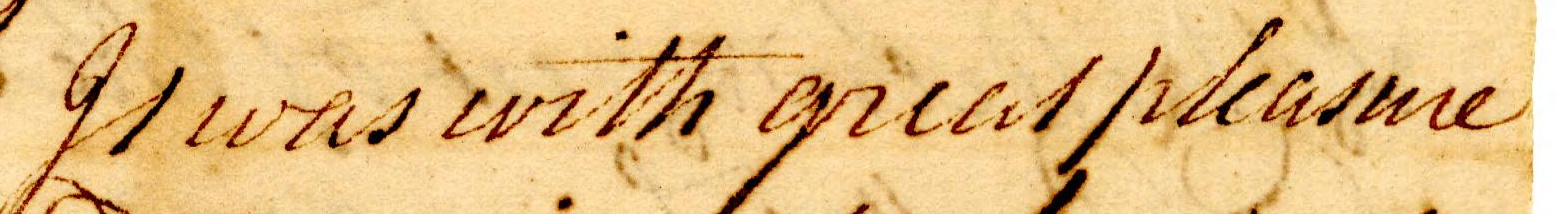It was with great pleasure
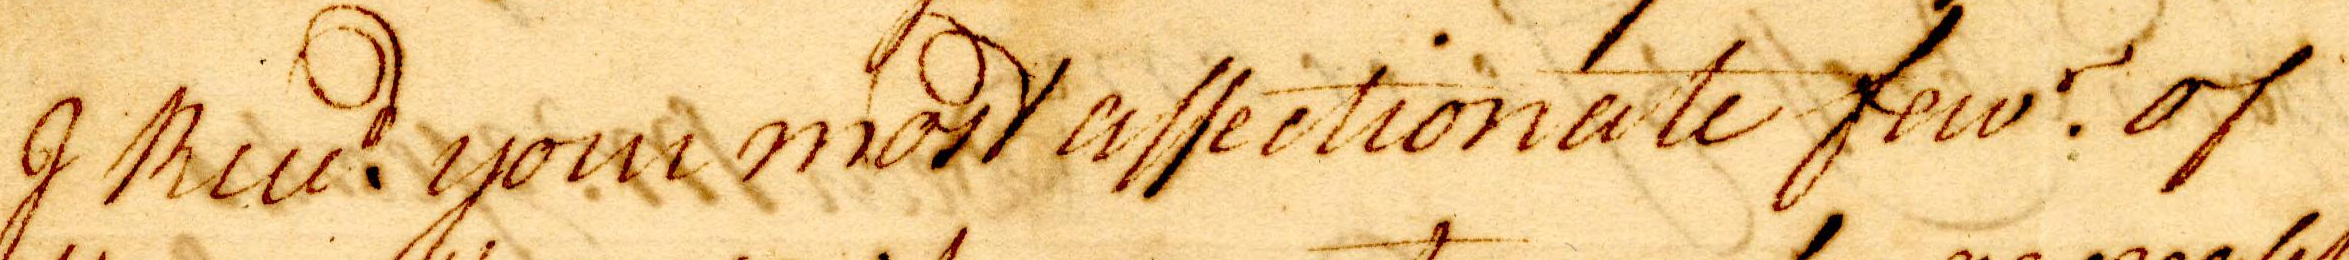I rece^d. your most affectionate fav^r. of
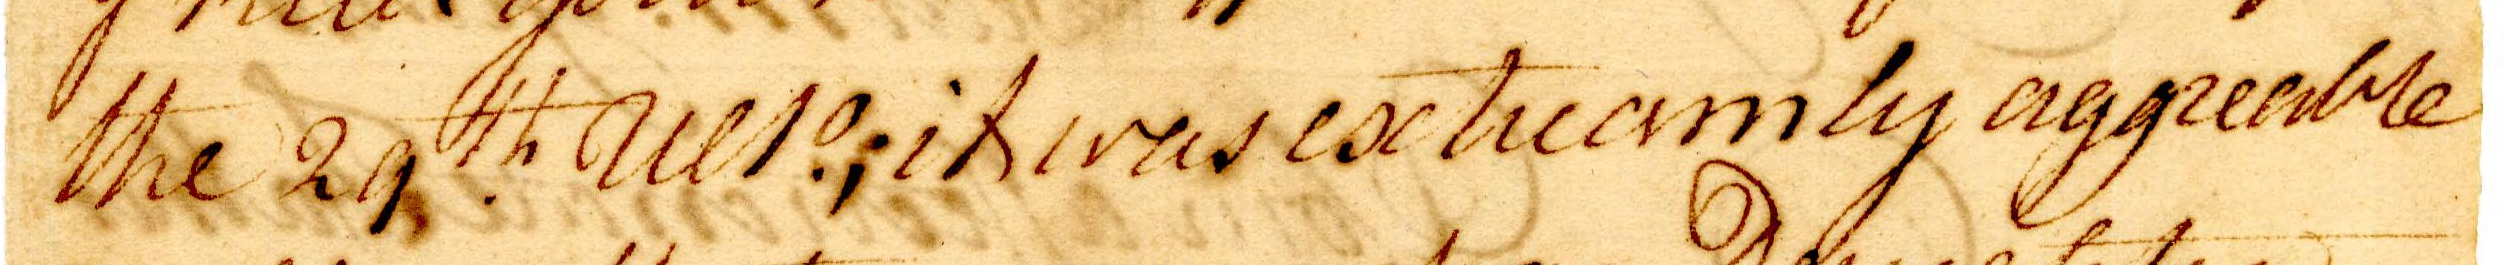the 29^th. Ult^o; it was extreamely aggreable
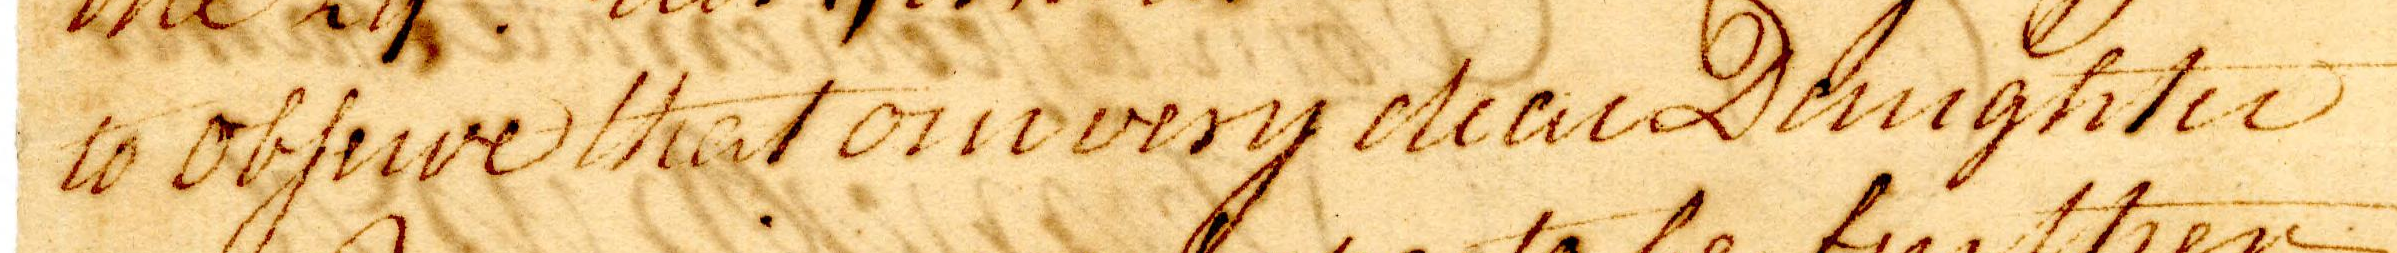to observe that our very dear Daughter
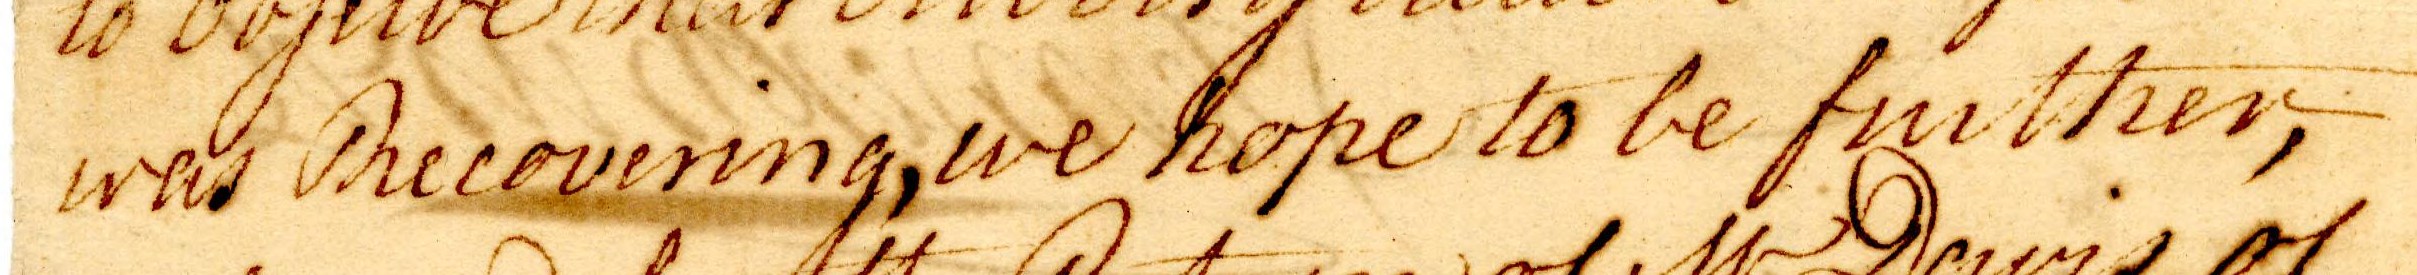was Recovering, we hope to be further,
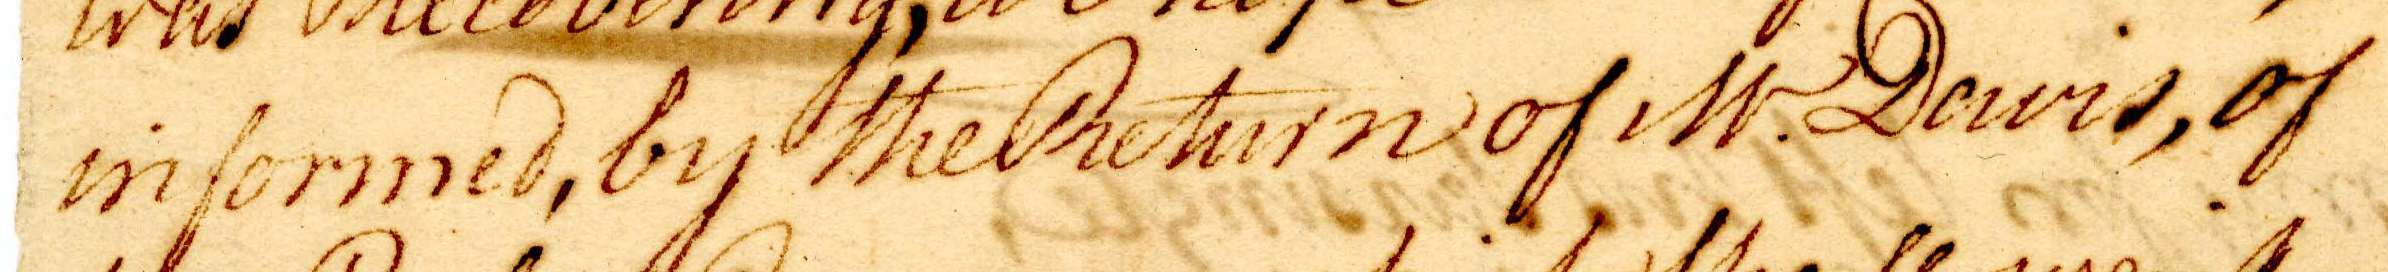informed, by the Return of M^r. Davis, of
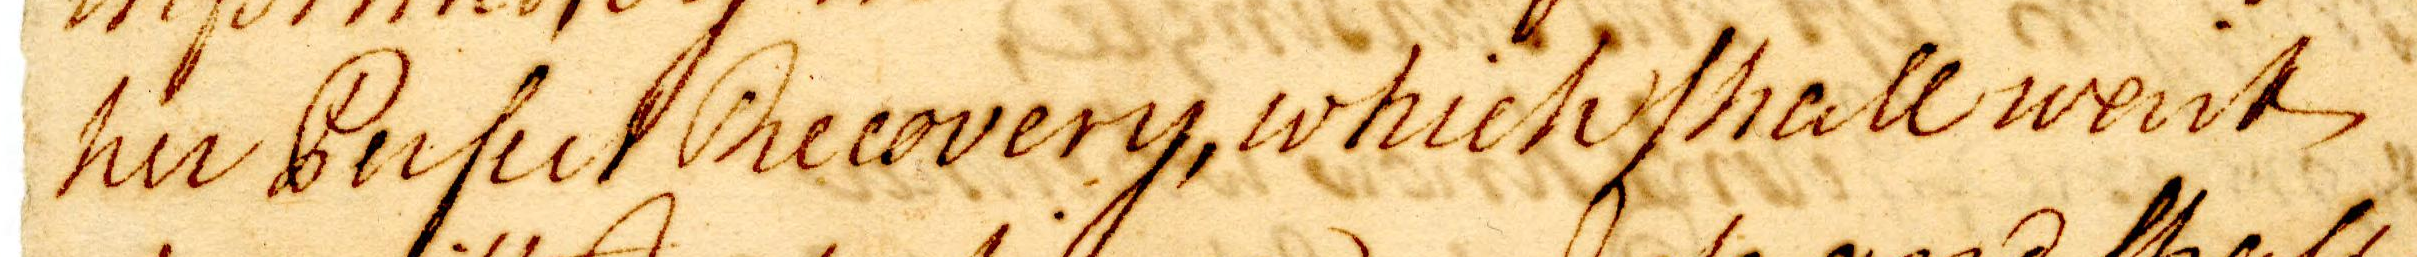her Perfect Recovery, which shall wait
